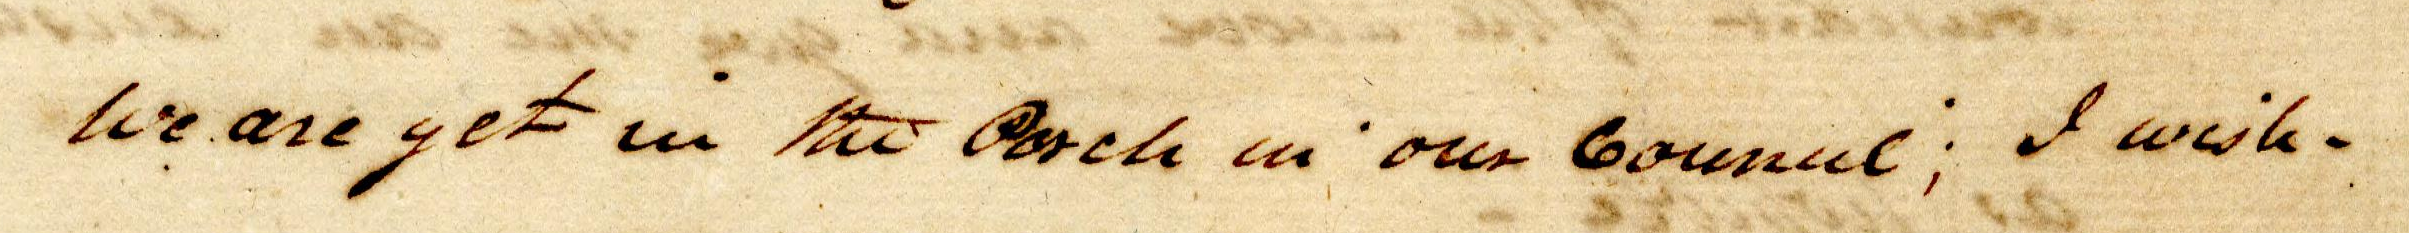we are yet in the Porch in our Councel; I wish
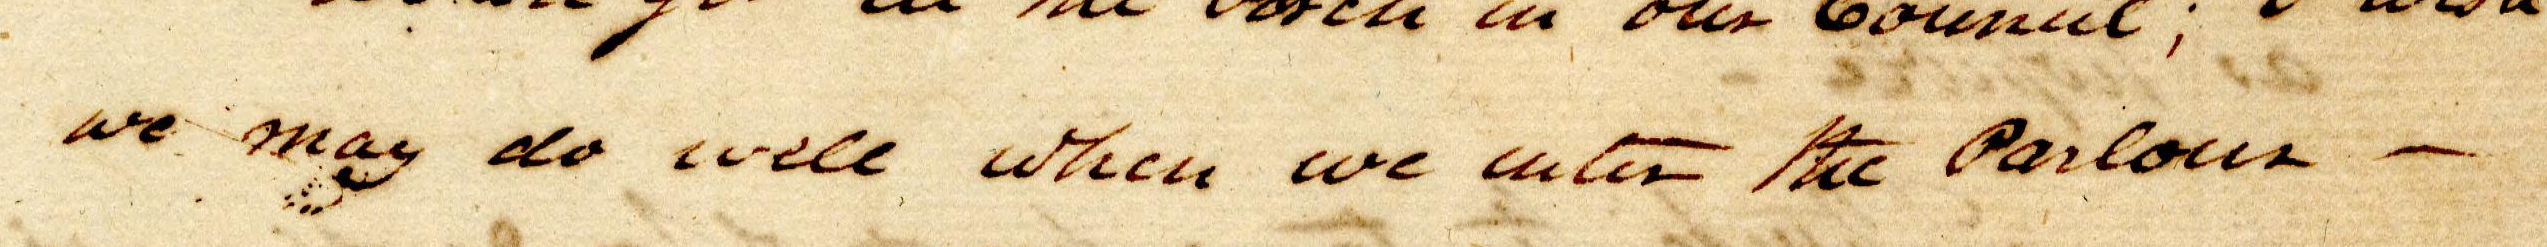we may do well, when we enter the Parlour
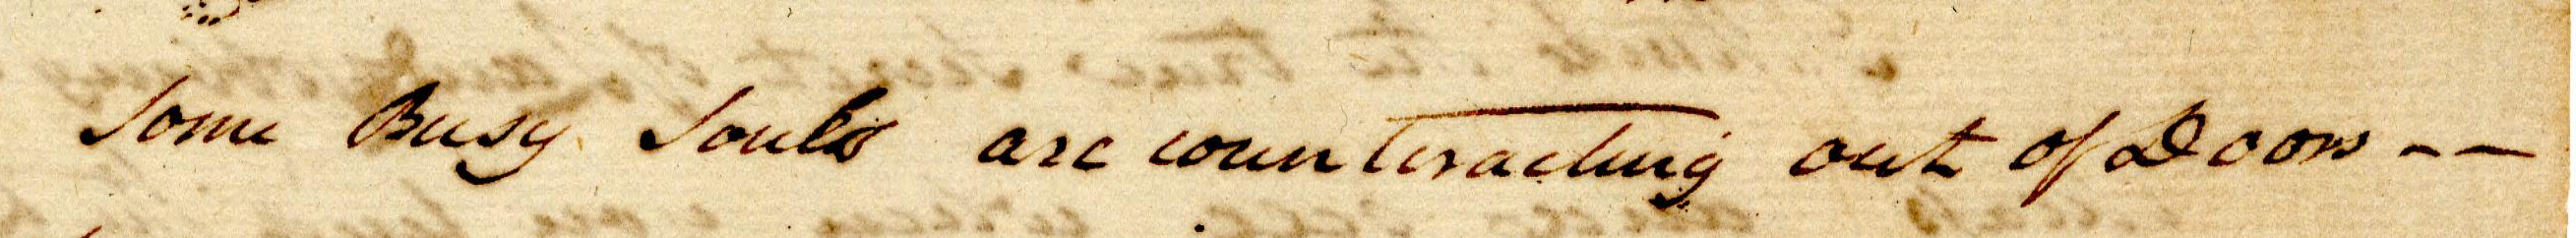some Busy Souls are counteracting out of Doors
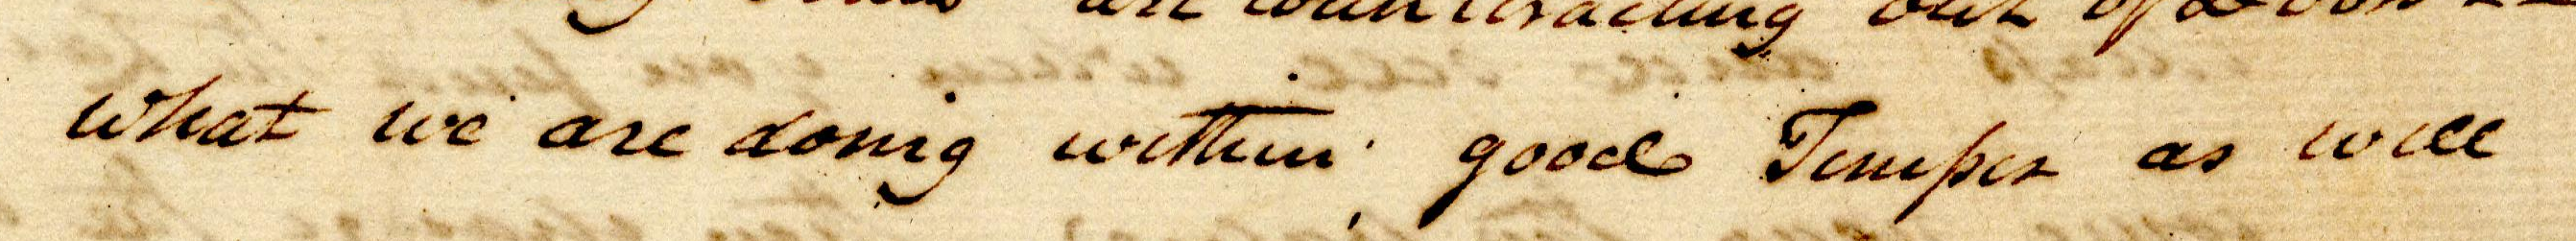what we are doing within good Temper as well
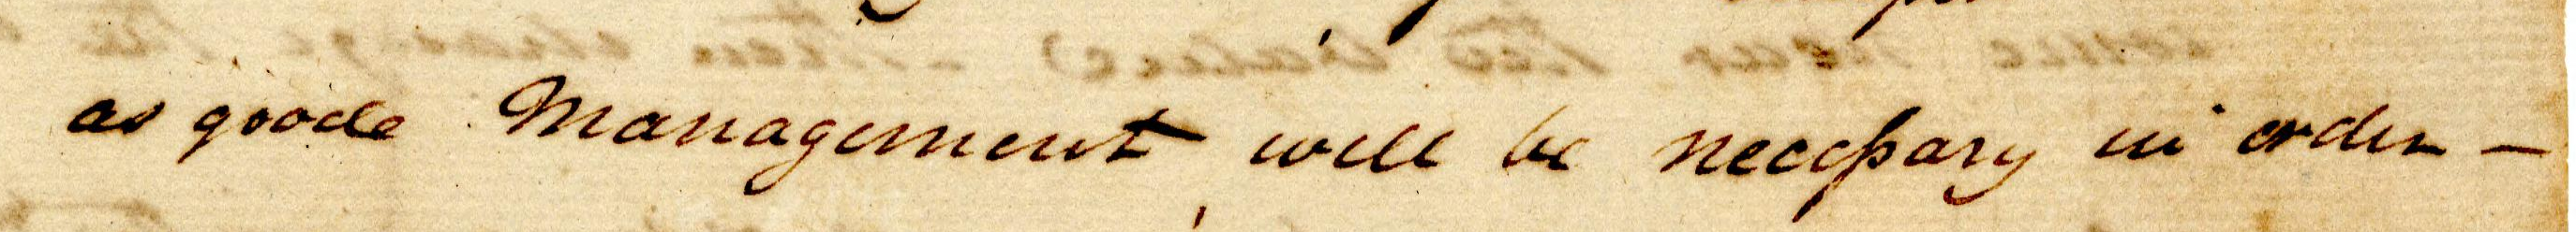as goode Management will be necesary in Order
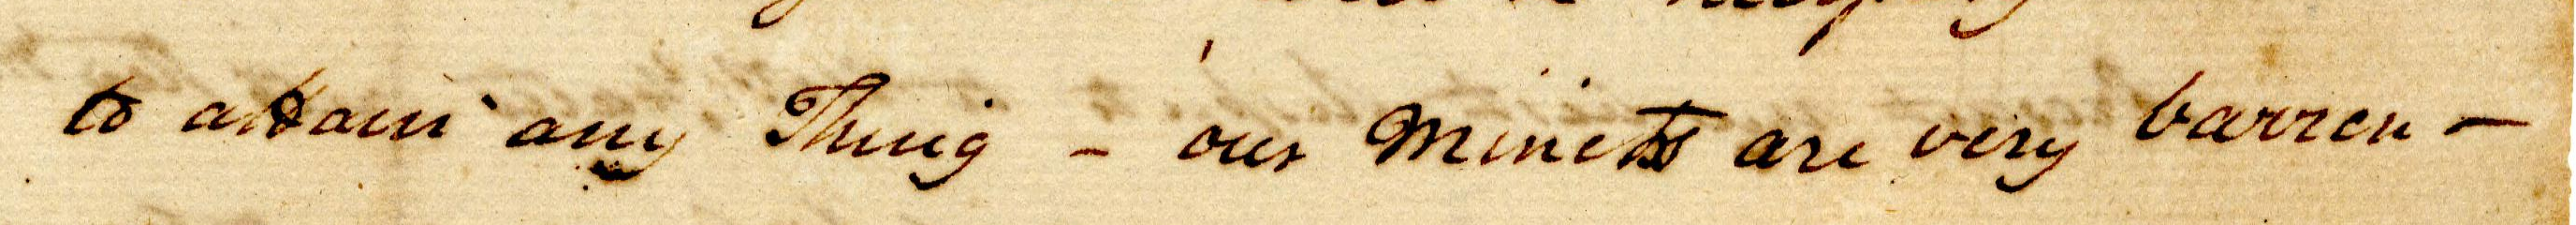to attain any Thing. our minets are very barren
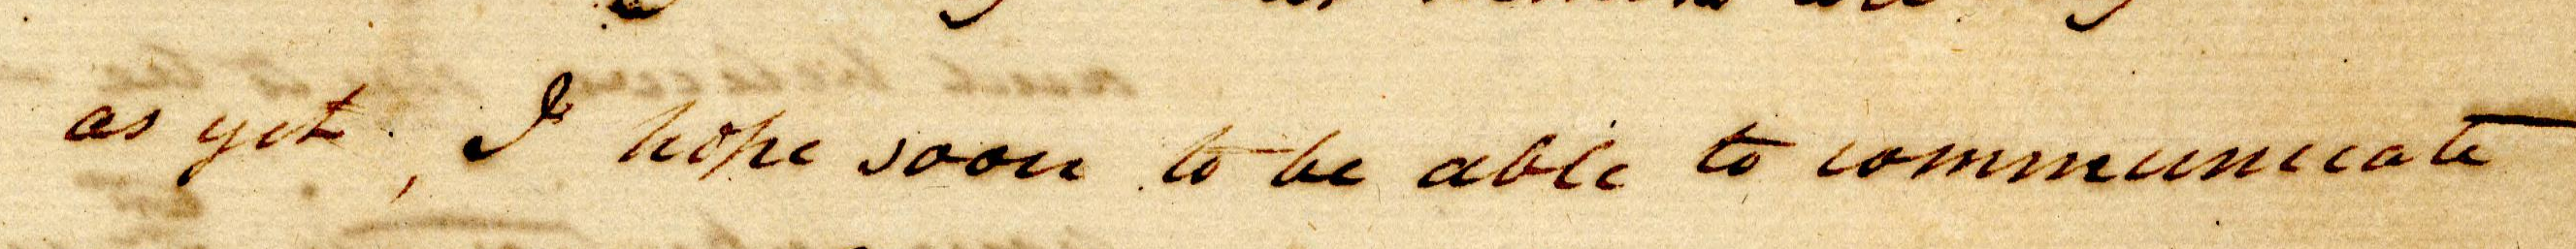as yet. I hope soon to be able to communicate
